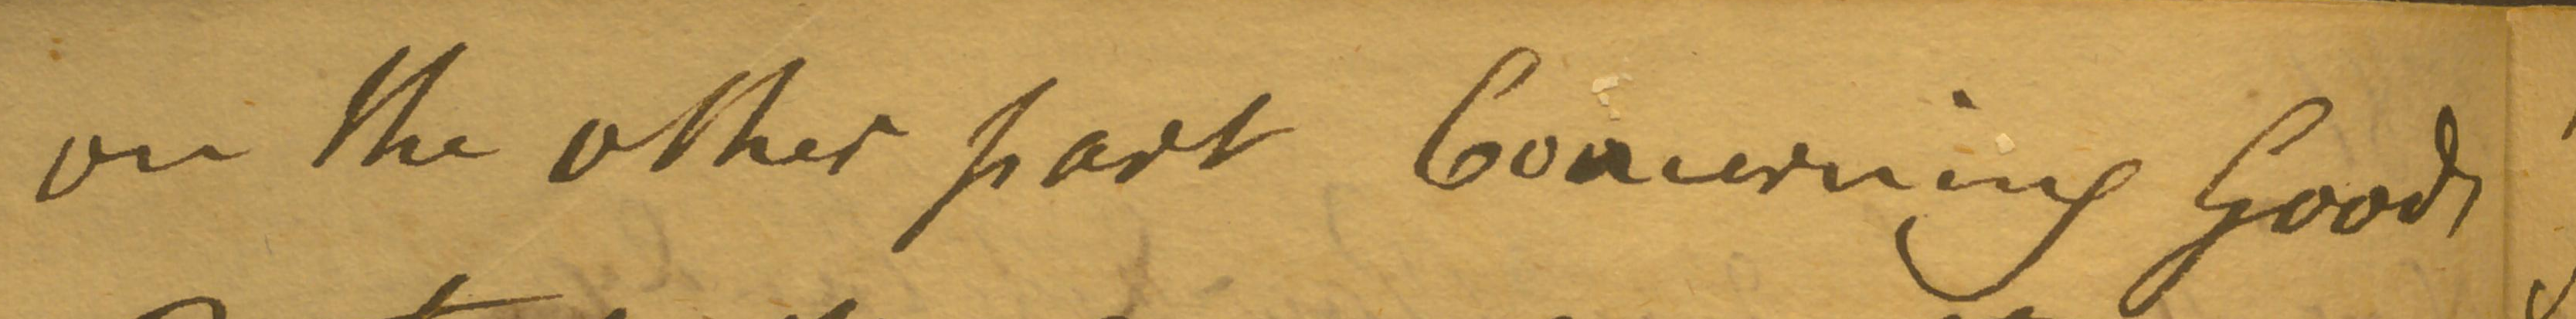on the other part Concerning Goods
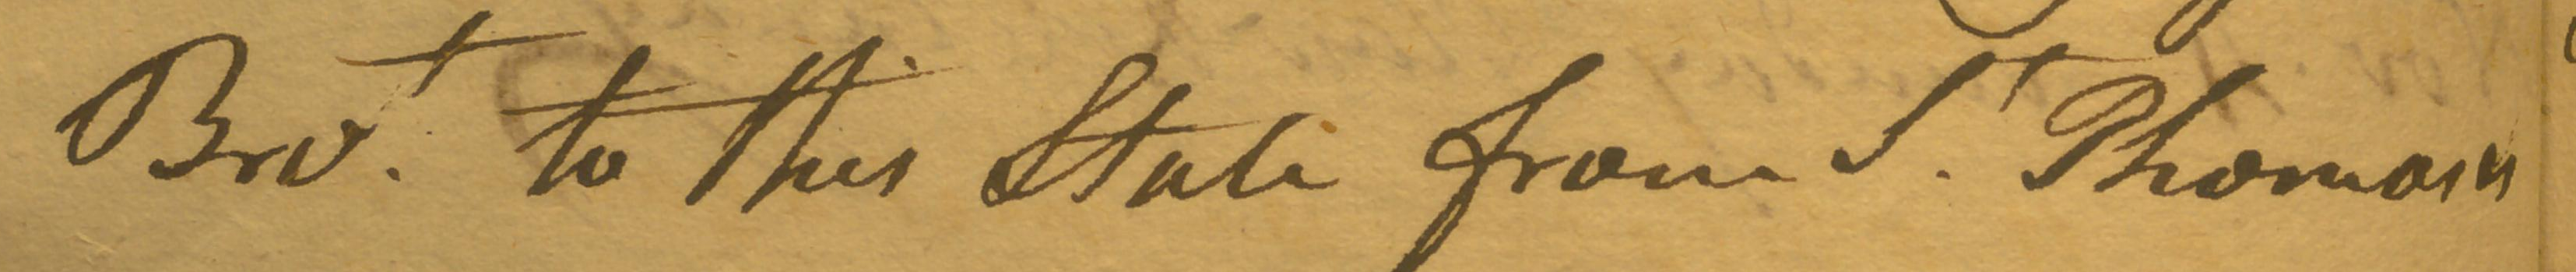Bro^t. to this State from S^t. Thomases
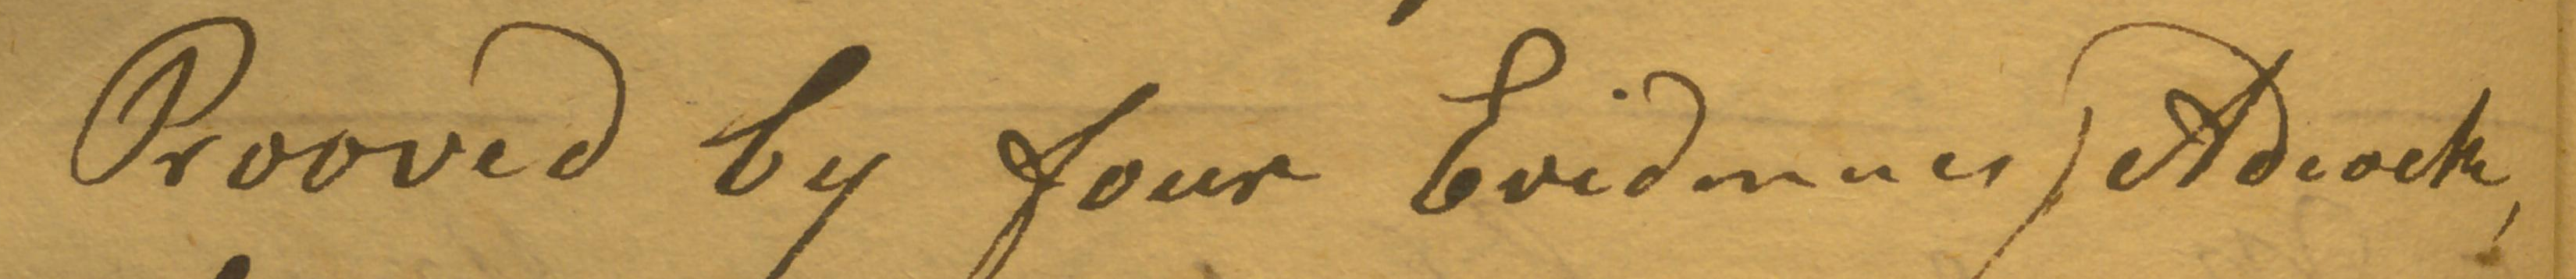Prooved by four Evidences) Adcock
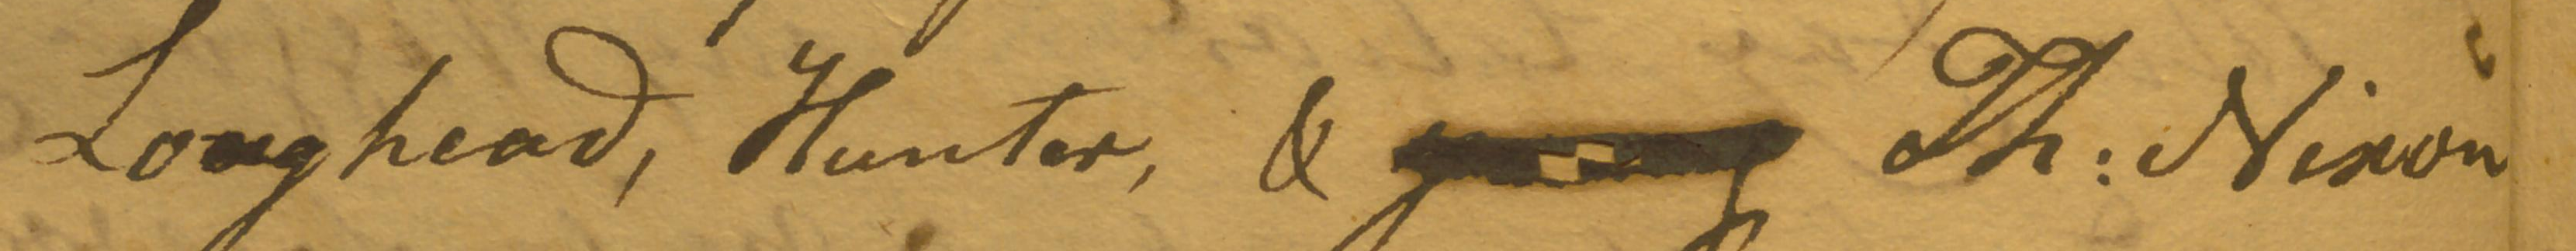Loaghead, Hunter, & [____] Th. Nixon
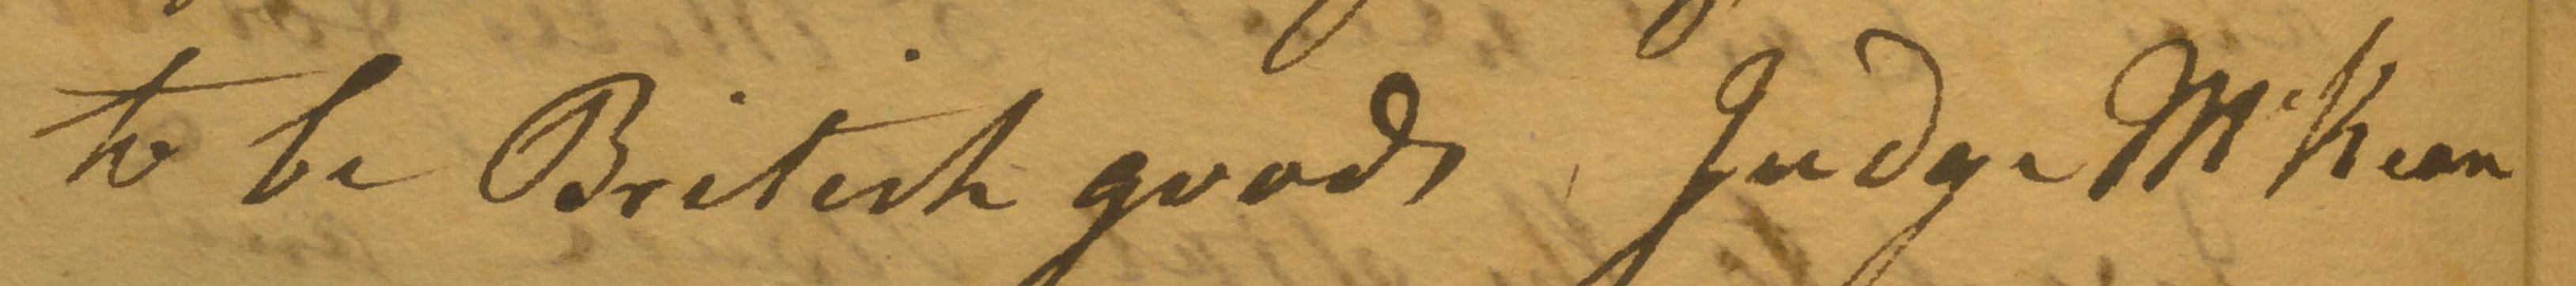to be British goods, Judge M^cKean
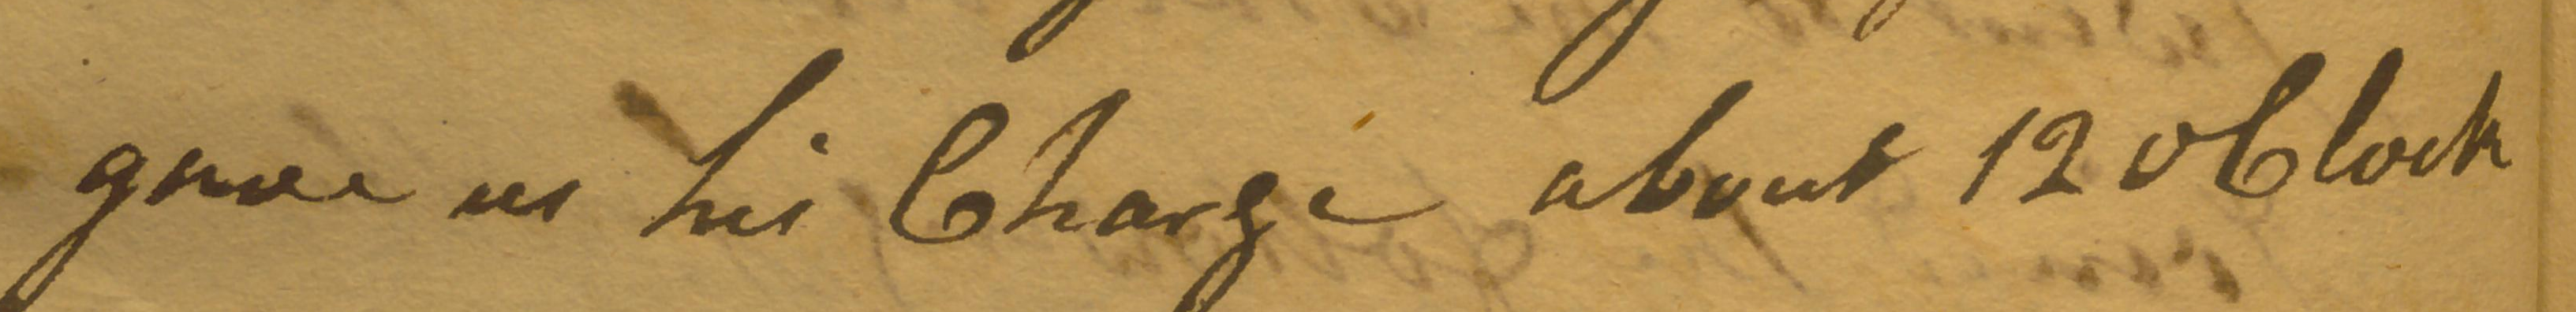gave us his Charge about 12 oClock
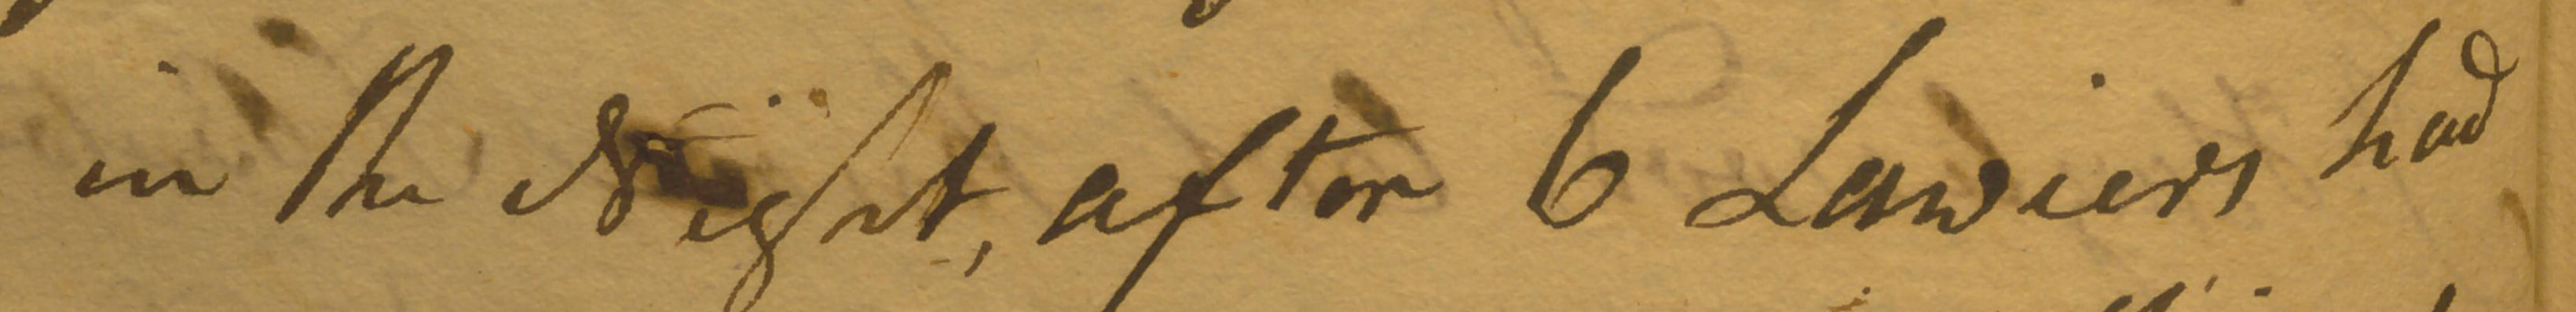in the Night, after 6 Lawiers had
